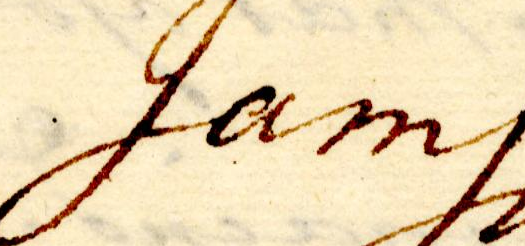I am
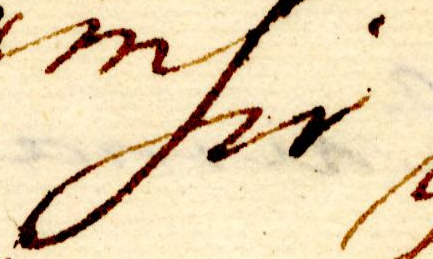Sir
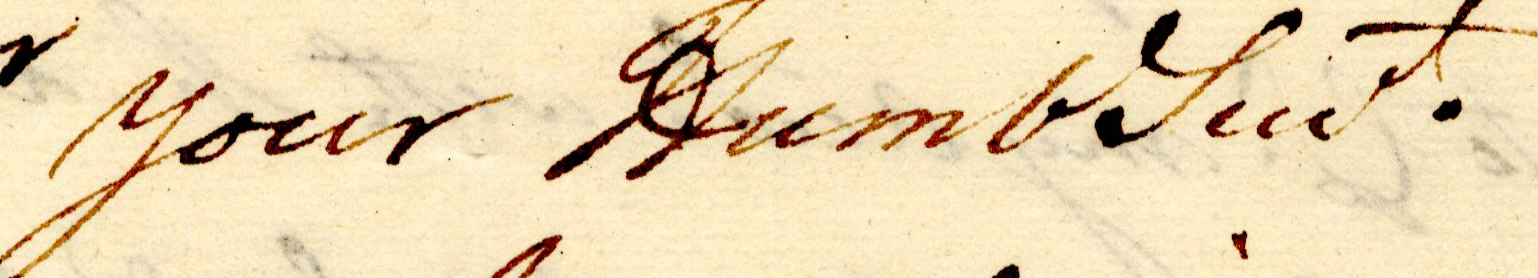Your Humb Serv^t.
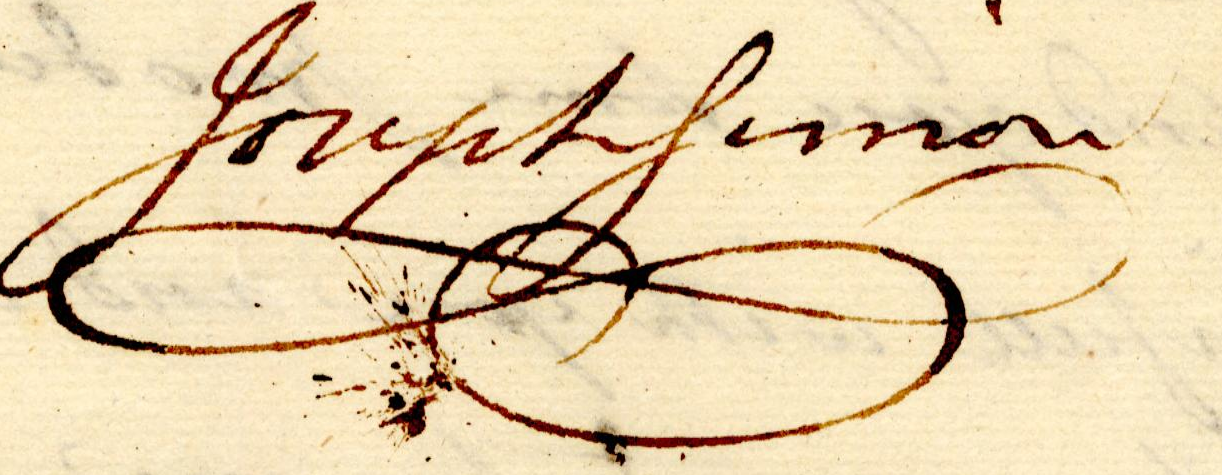Joseph Simon
